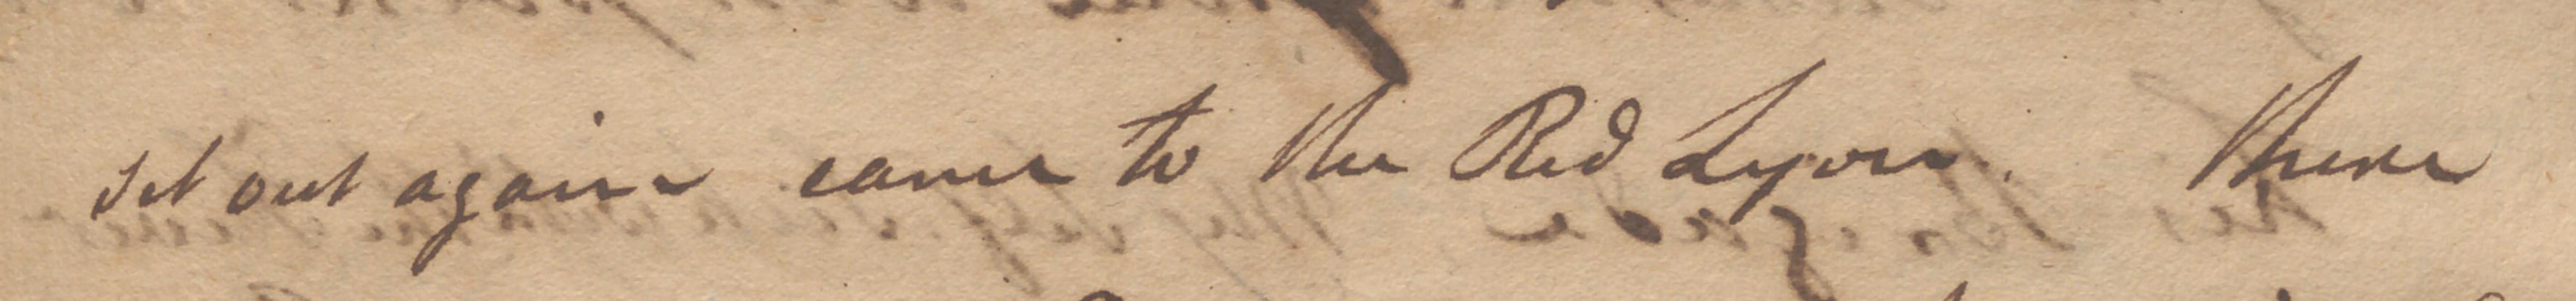set out again- came to the Red Lyon. there
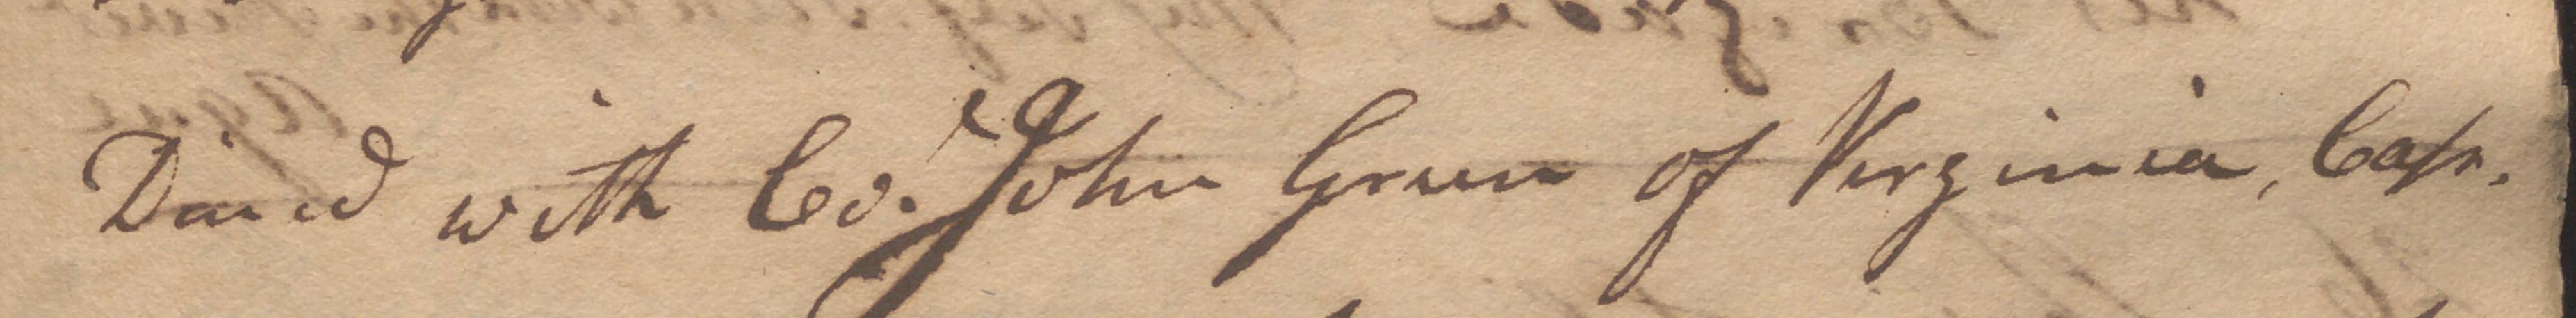Dined with Co^l. John Green of Virginia, Cap.
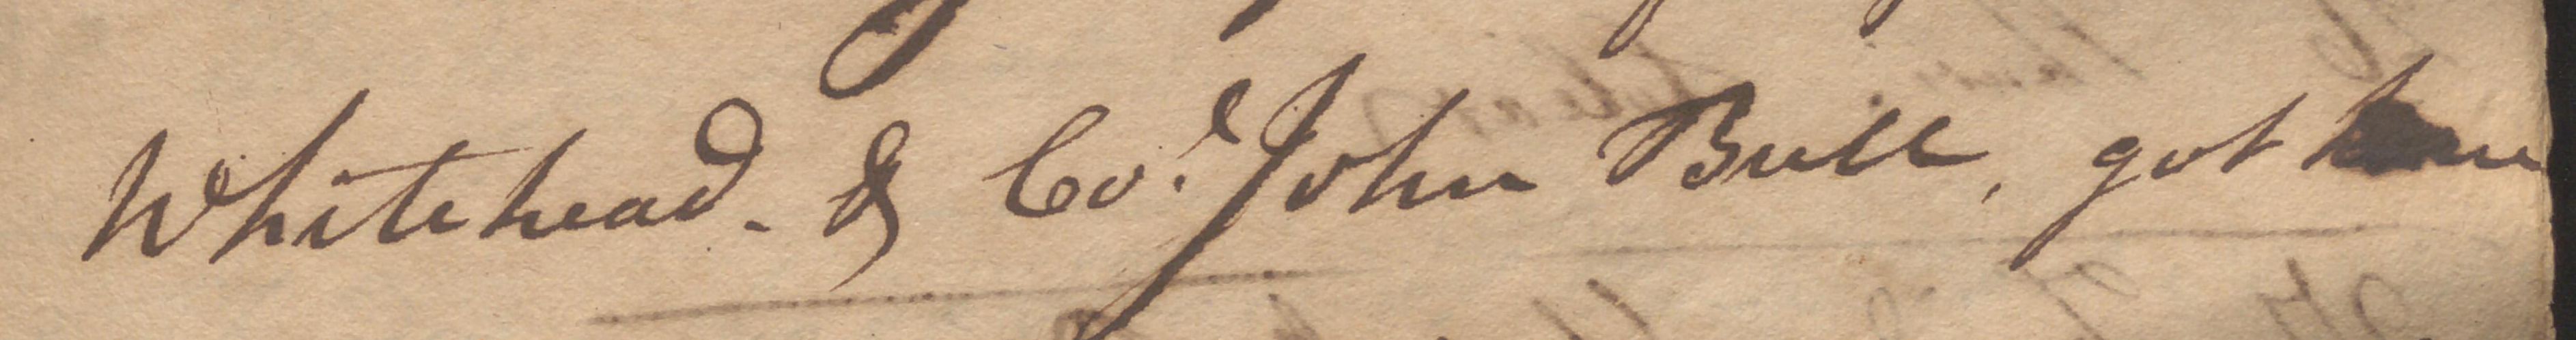Whitehead. & Co^l. John Bull, got here
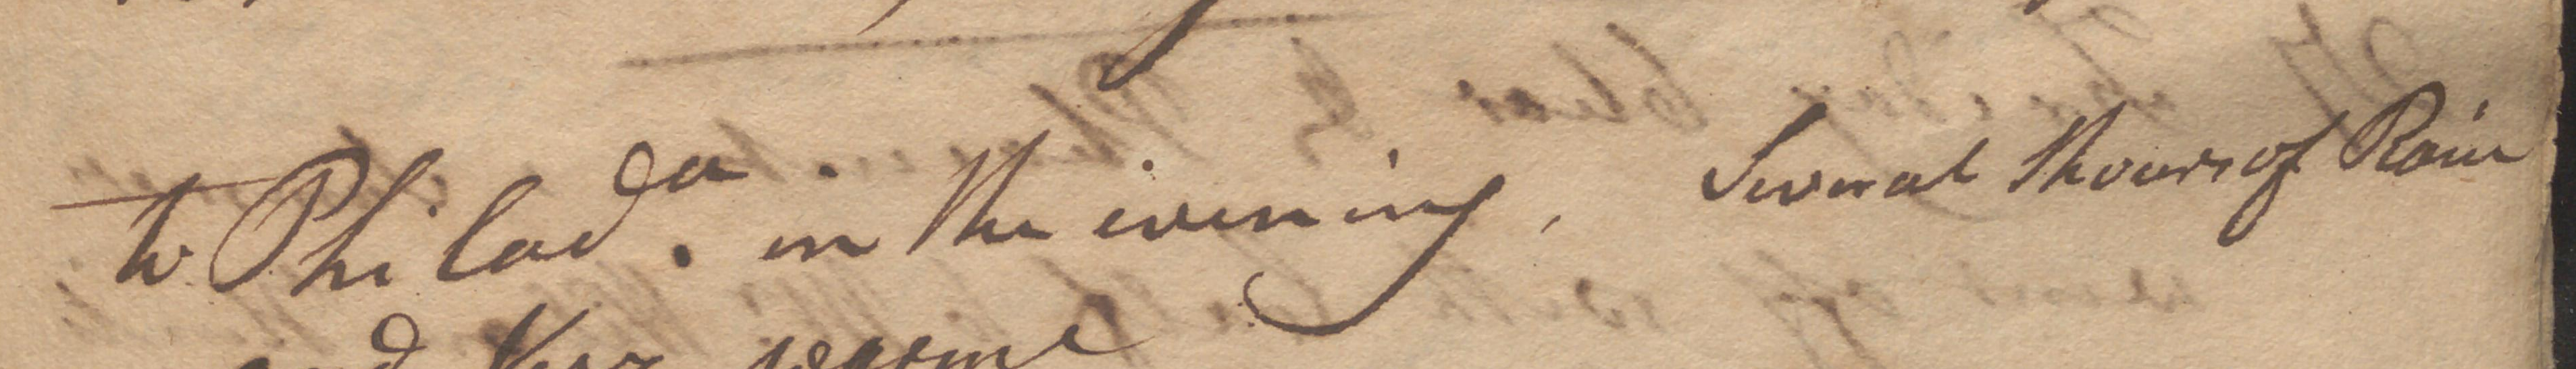to Philad^a. in the evening, Several shours of Rain
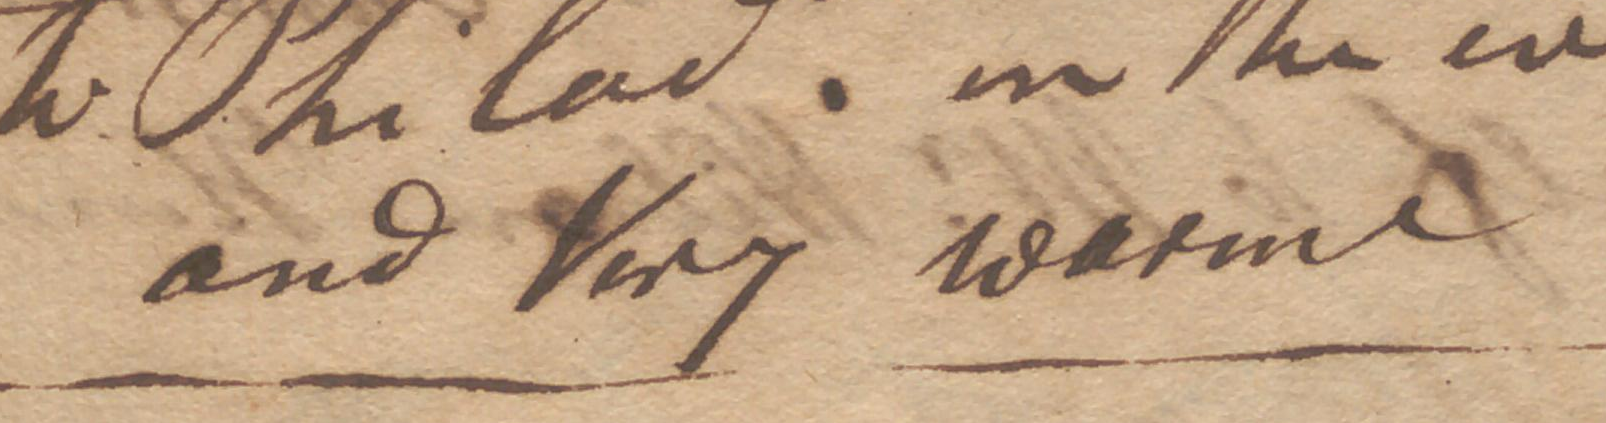and Very warme
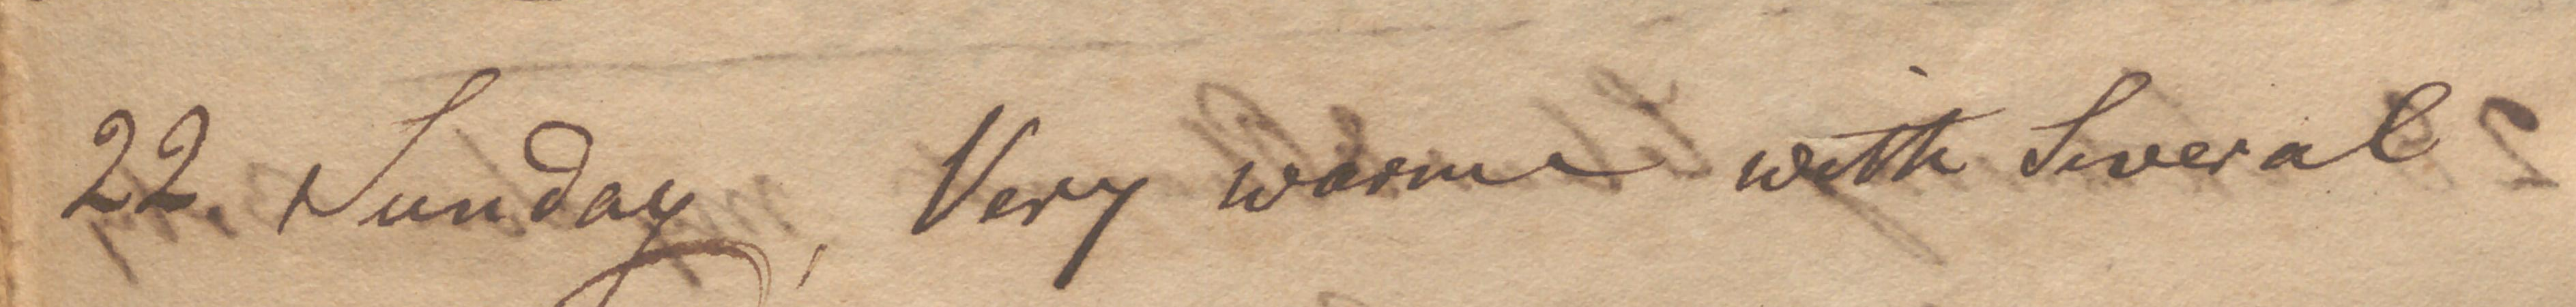22 Sunday, Very warme with several
